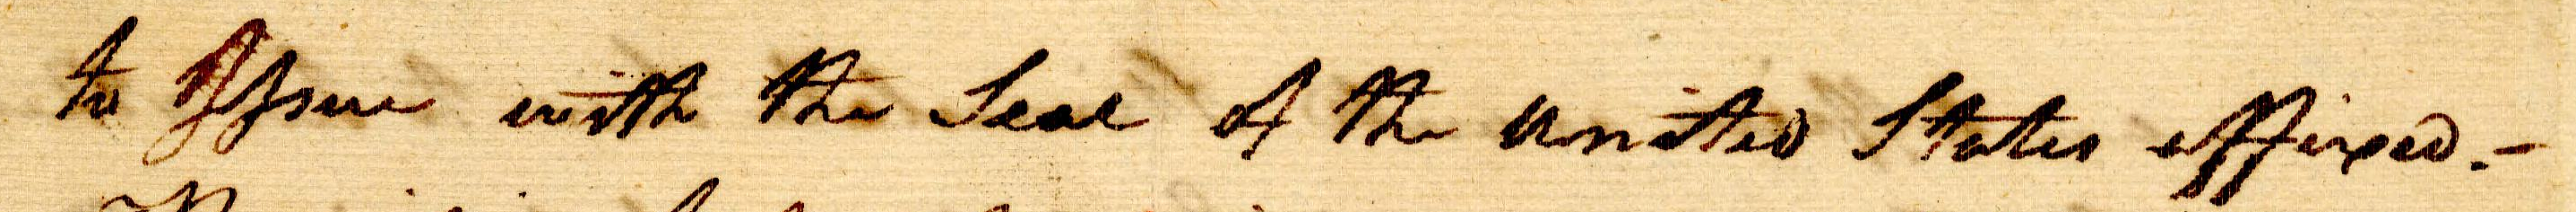to Issue with the Seal of the United States affixed.-
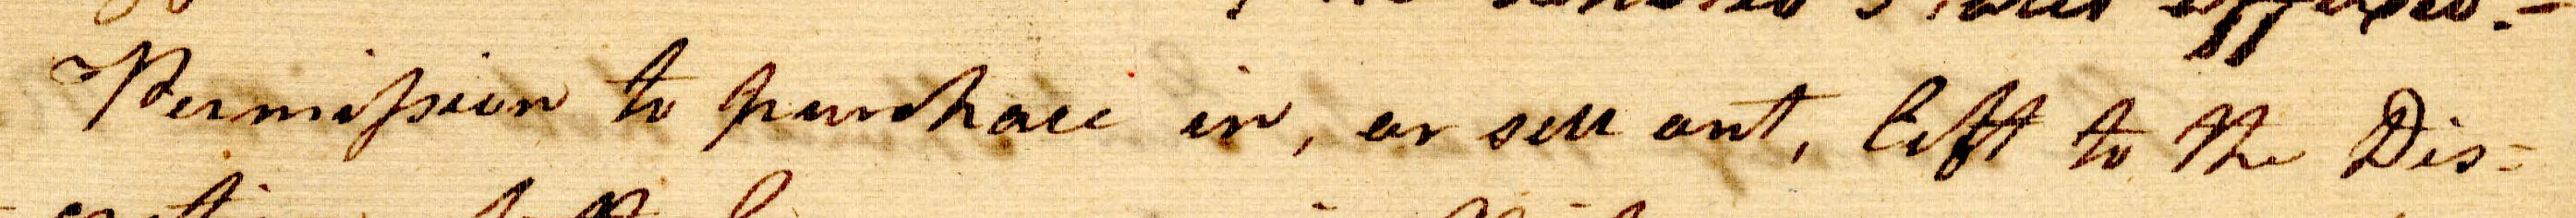Permission to purchase in, or sell out, left to the Dis-
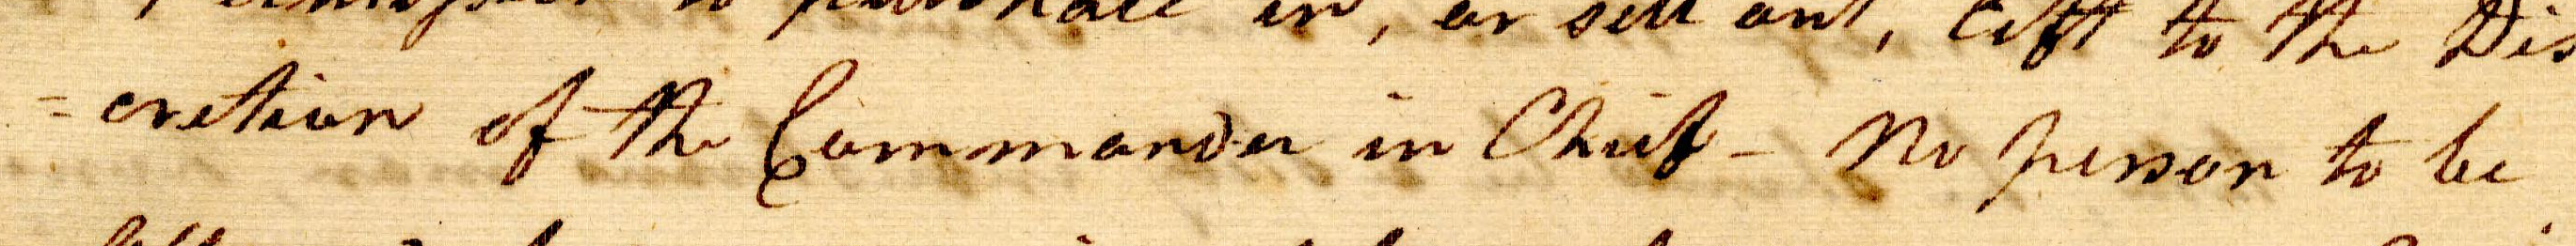-cretion of the Commander in Chief- no person to be
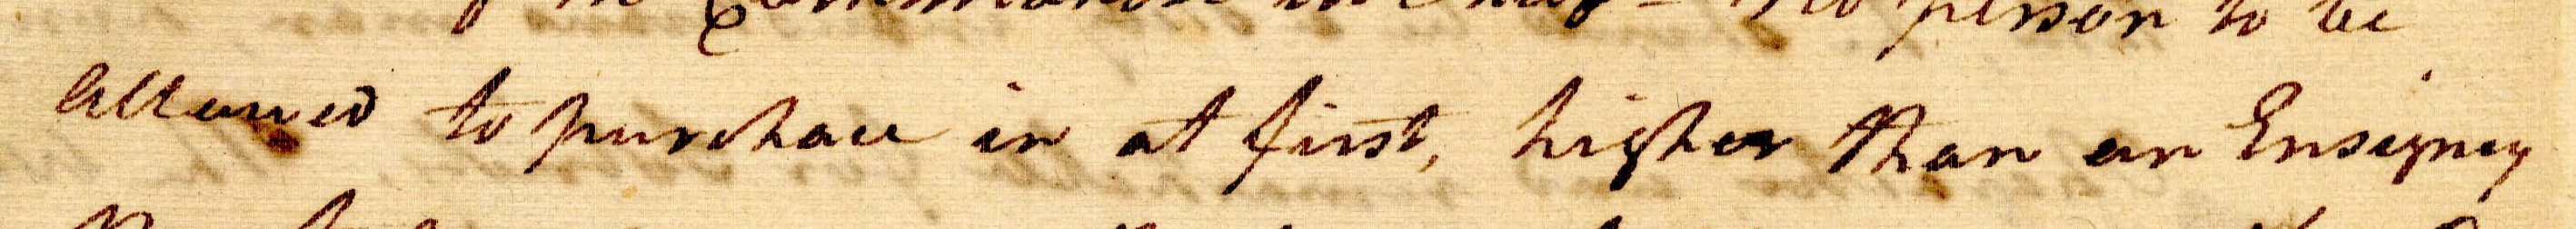allowed to purchase in at first, higher than an Ensigncy
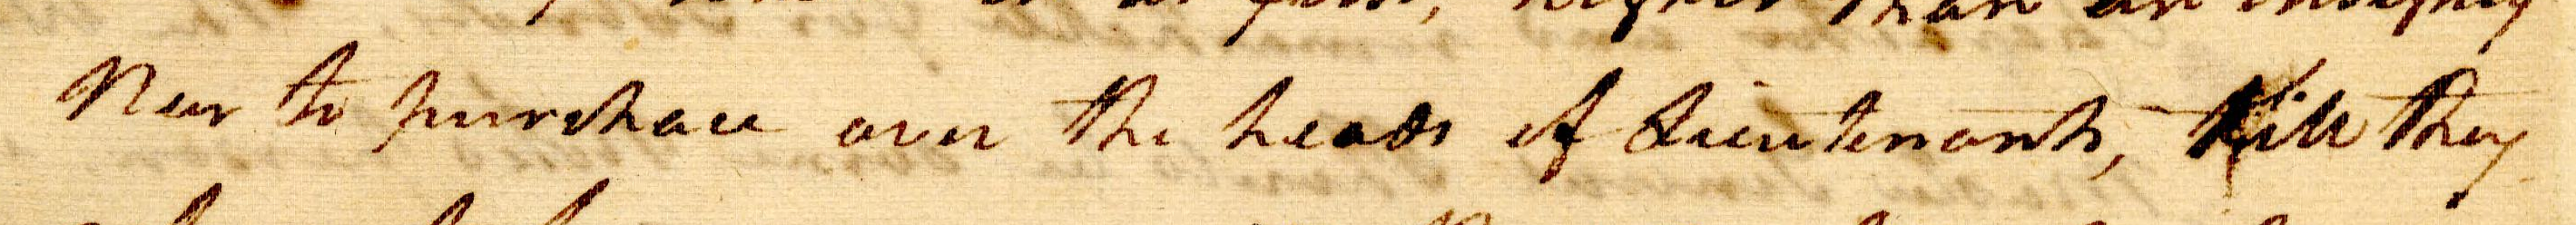nor to purchase over the heads of Lieutenants, till they
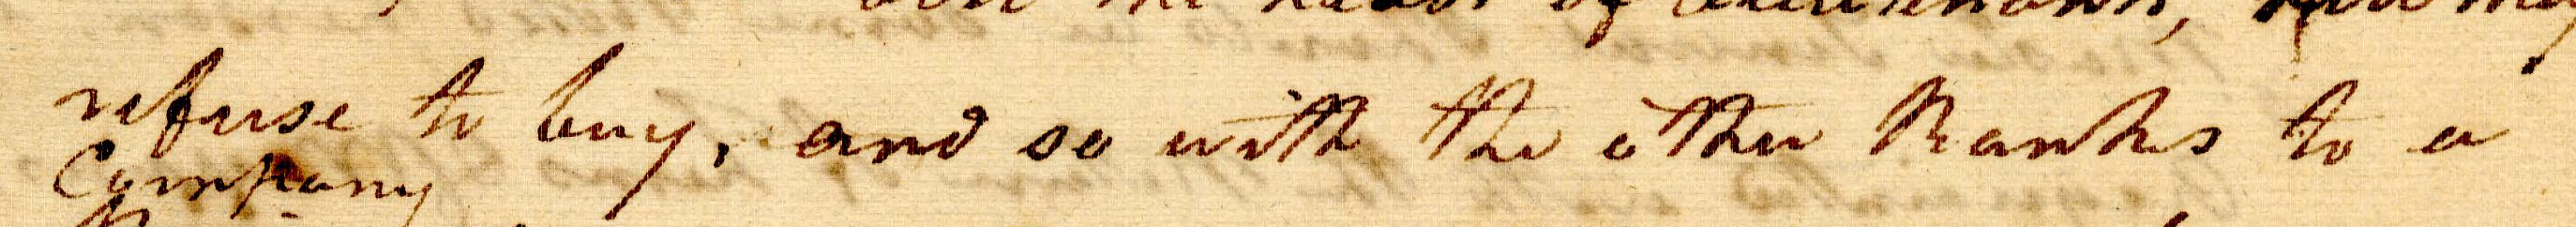refuse to buy, and so with the other Ranks to a
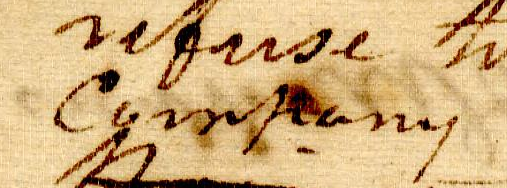Company
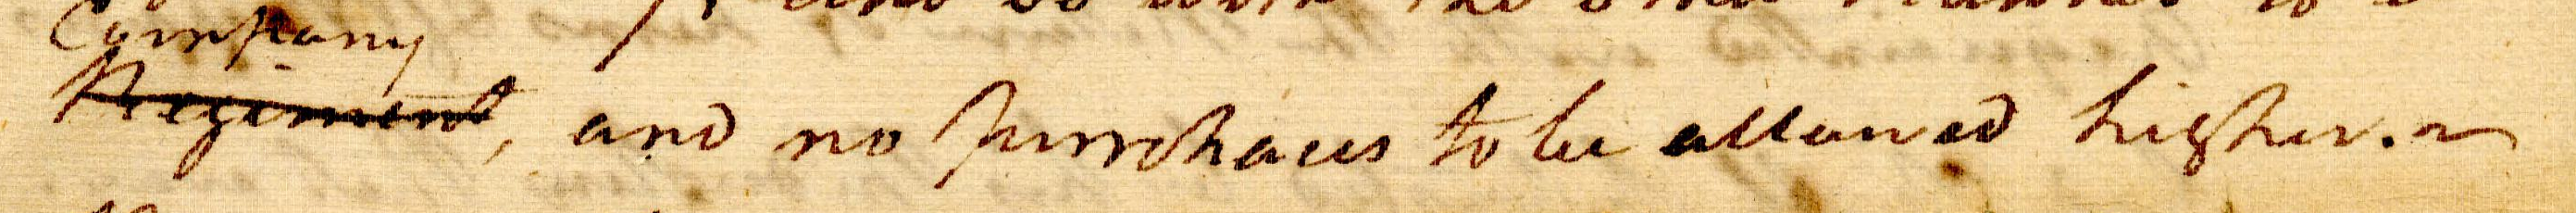[Regiment], and no purchases to be allowed higher.-
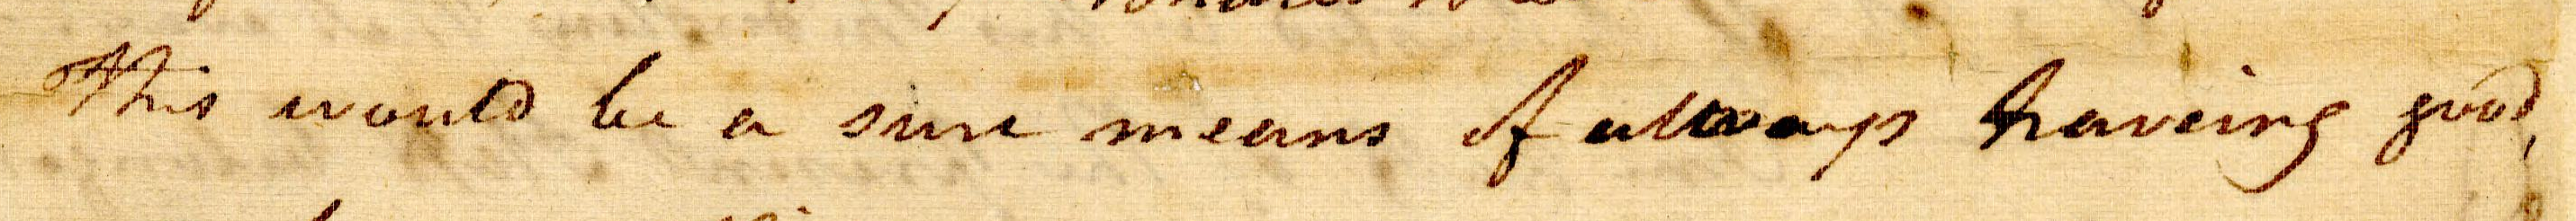This would be a sure means of always having good,
